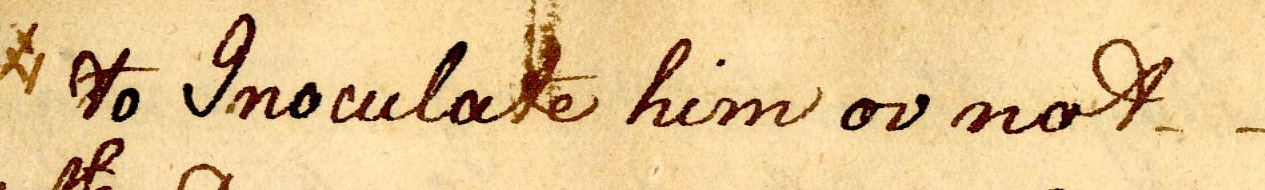to Inoculate him or not-
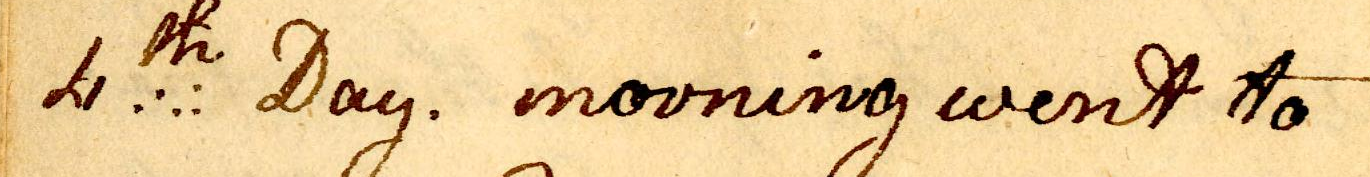4^th Day. morning went to
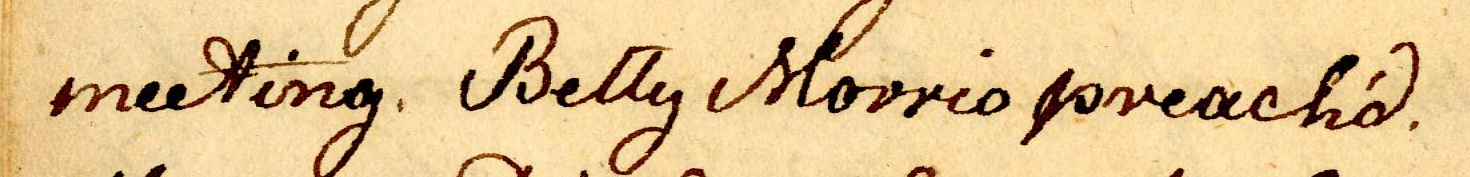meeting. Betty Morris preached.
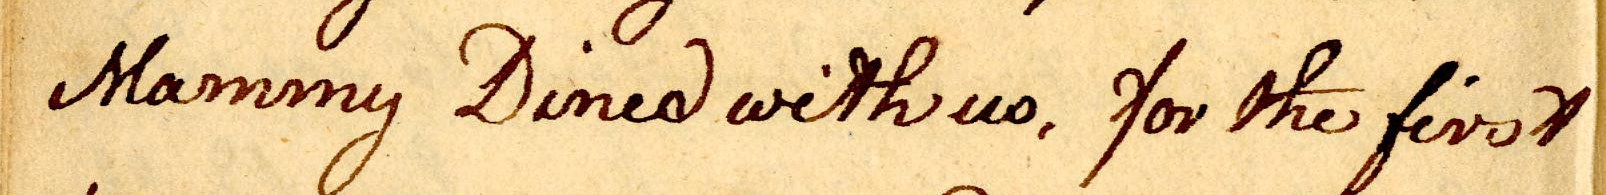Mammy Dined with us, for the first
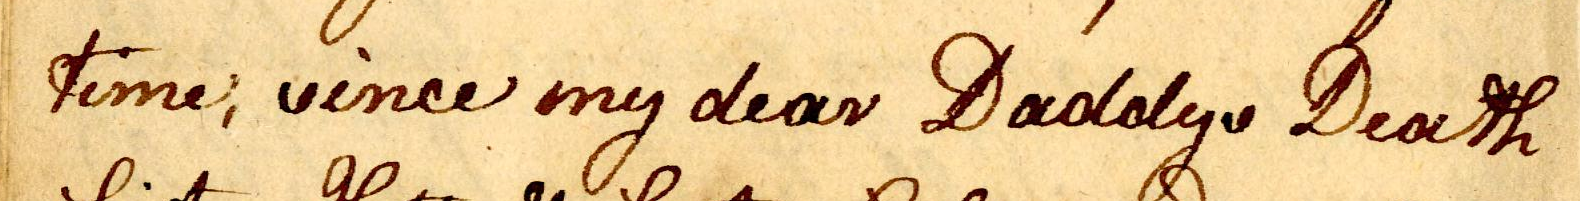time, since my dear Daddys Death
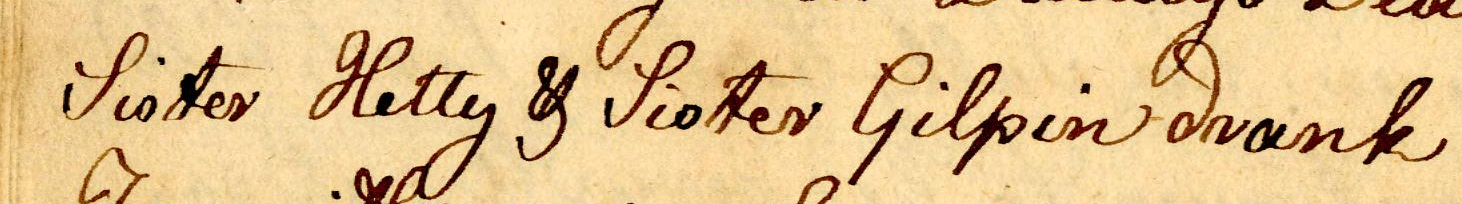Sister Hetty & Sister Gilpin drank
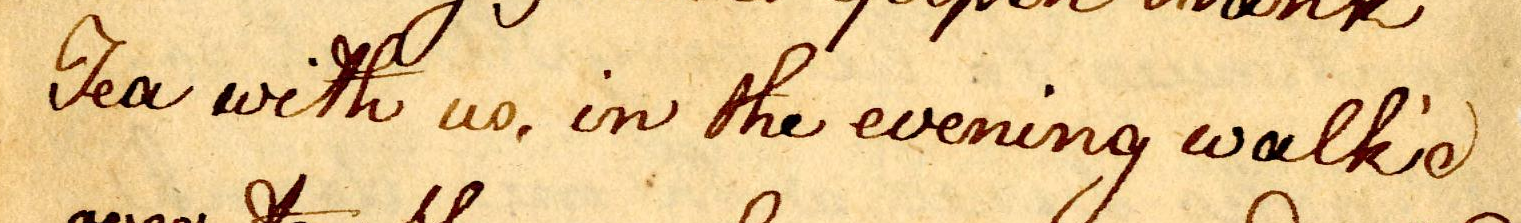Tea with us, in the evening walk'd
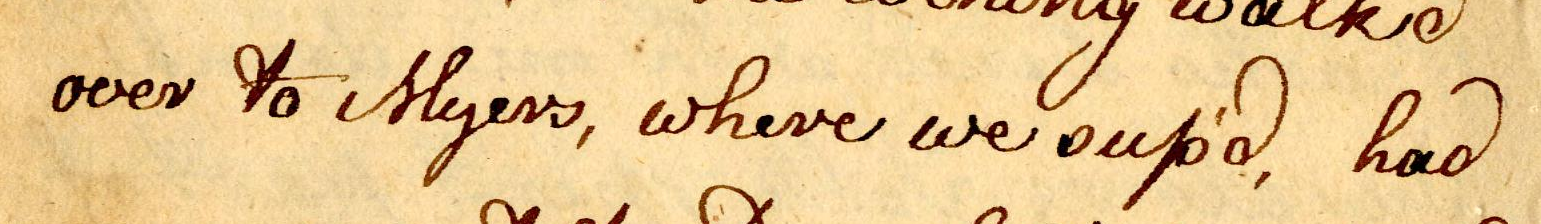over to Myers, where we sup'd, had
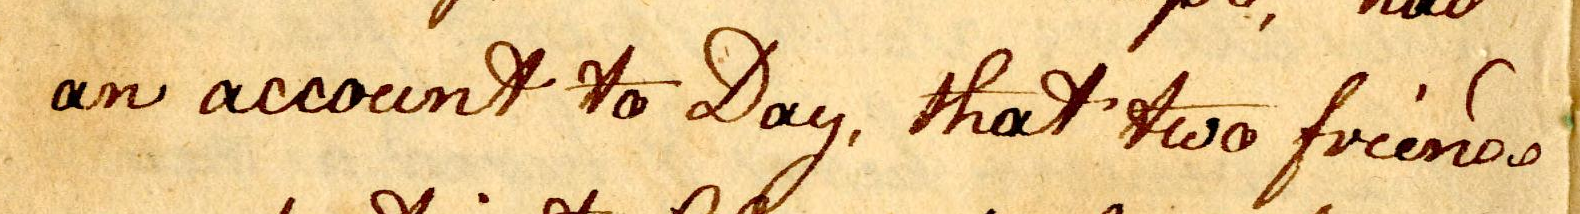an account to Day, that two friends
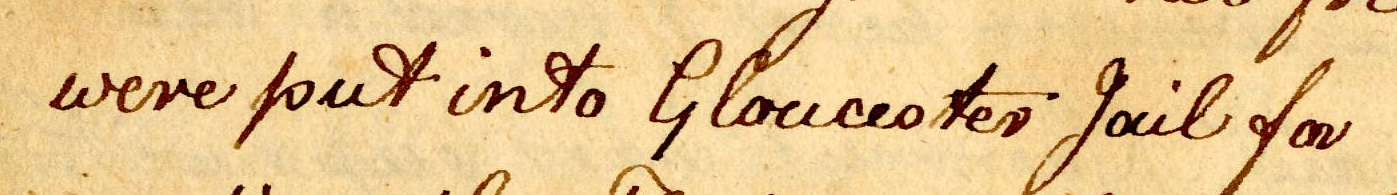were put into Gloucester Jail for
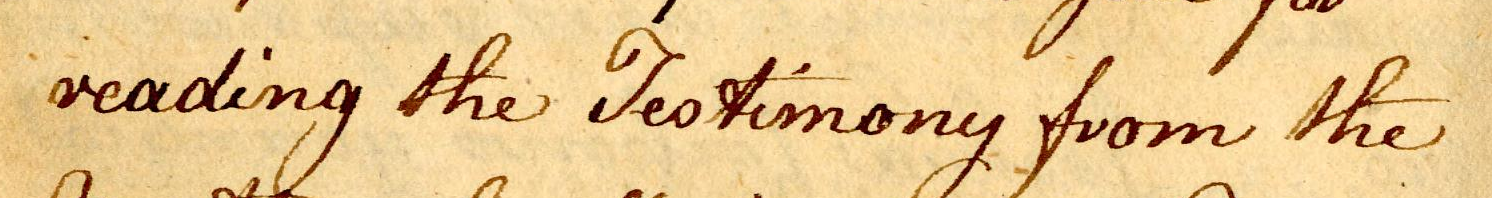reading the Testimony from the
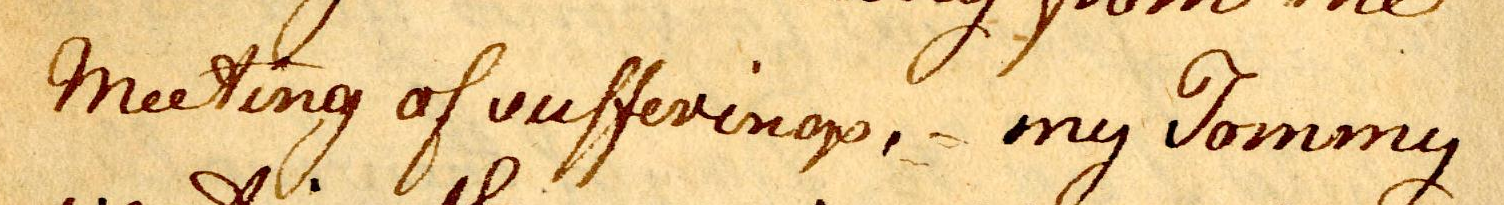Meeting of sufferings,- my Tommy
